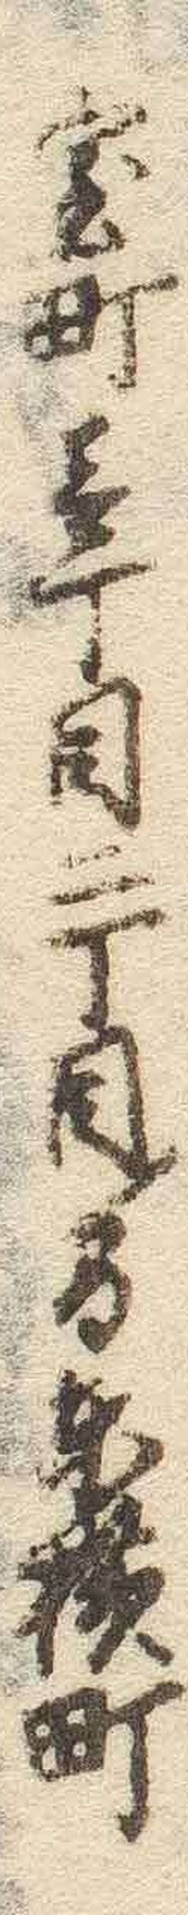室町壱丁目二丁目ノ間東横町
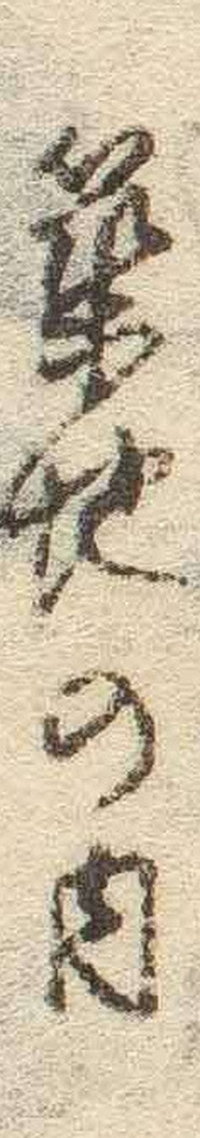築地の内
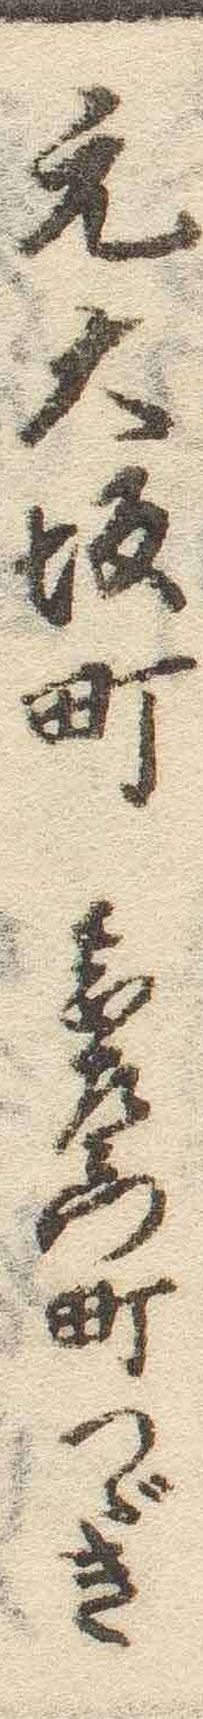元大坂町甚左衛門町つゞき
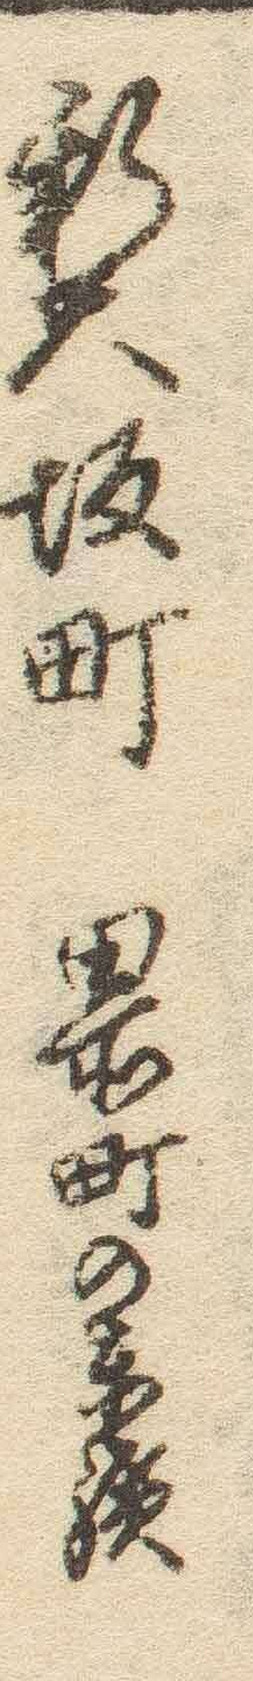新大坂町田所町の東続
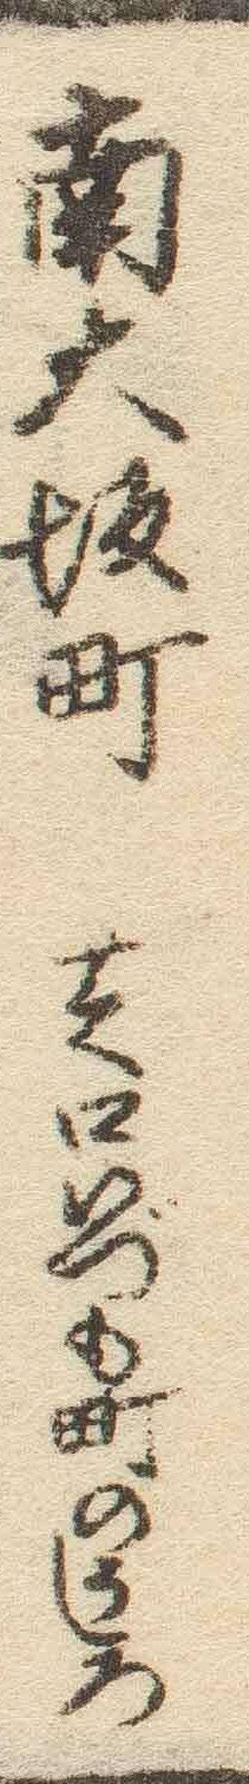南大坂町芝口いづも町のうしろ
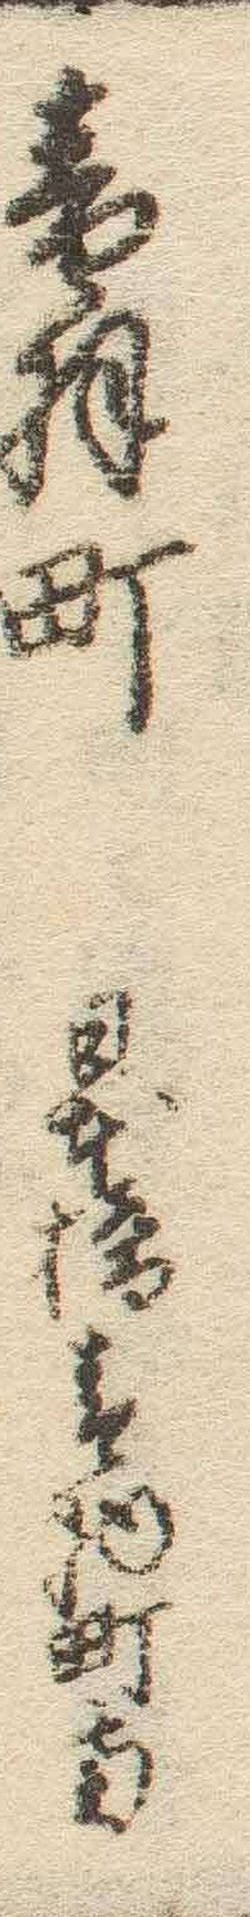音羽町日本橋青物町南
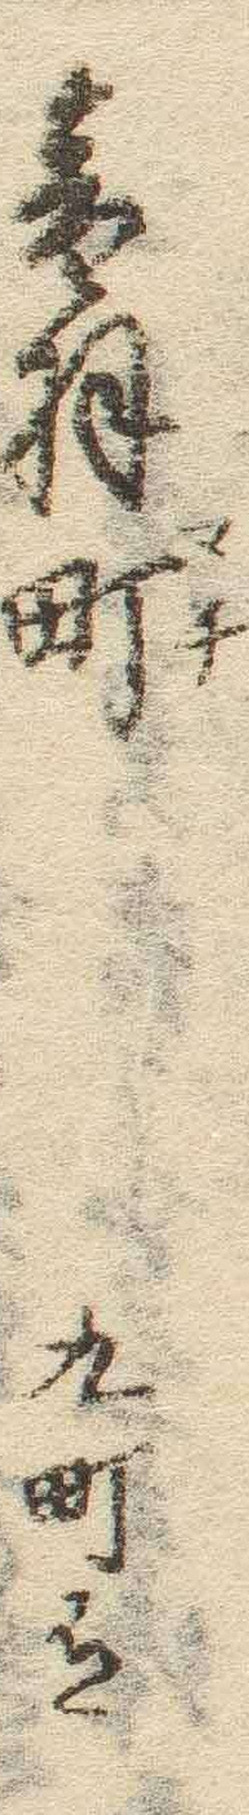音羽町九町有
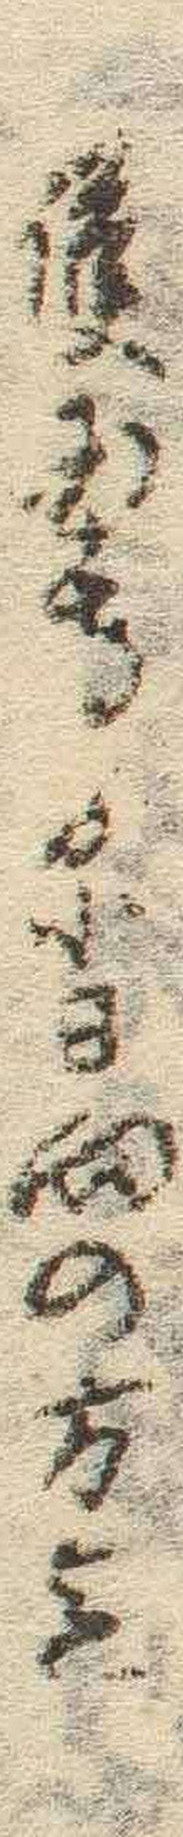護国寺ゟ小日向の方迄
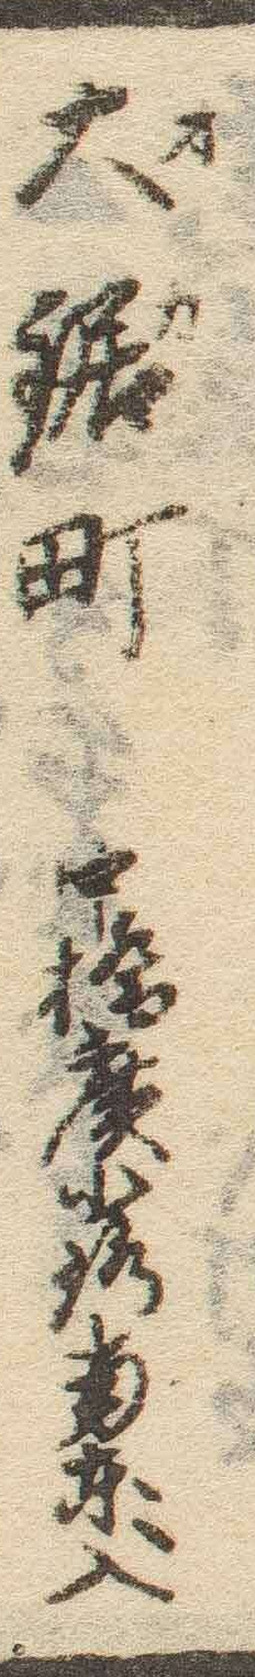大鋸町中橋広小路南東へ入

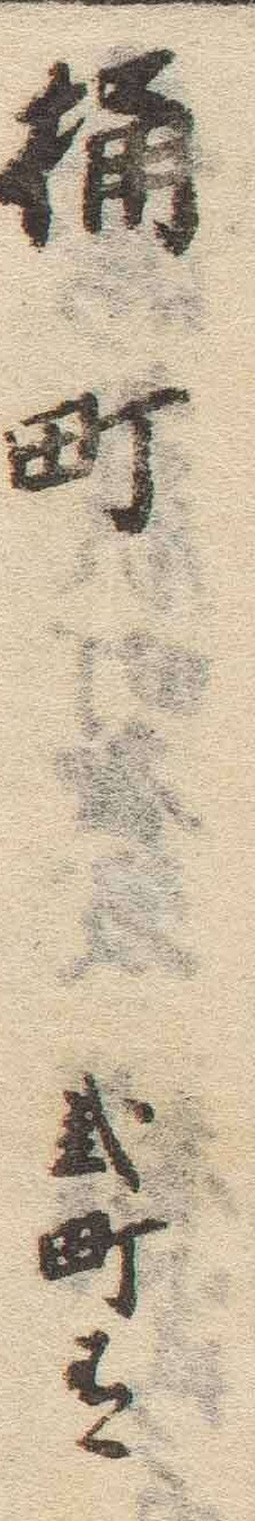桶町弐町有
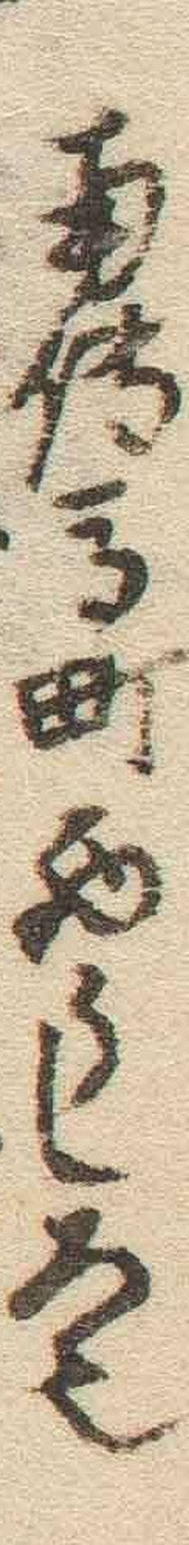南伝馬町西うしろ也
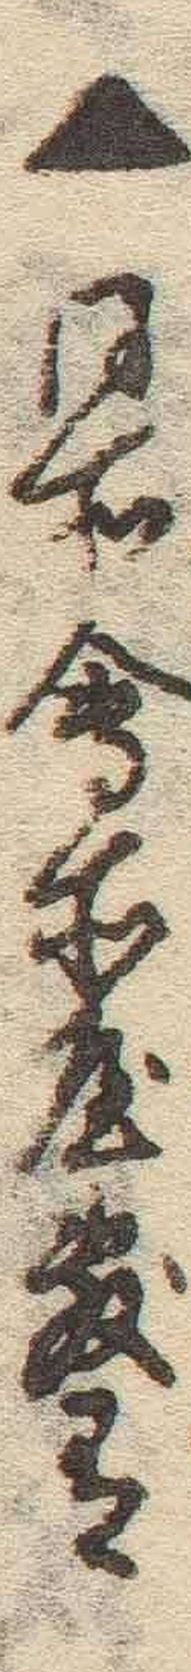▲同所会所屋敷有
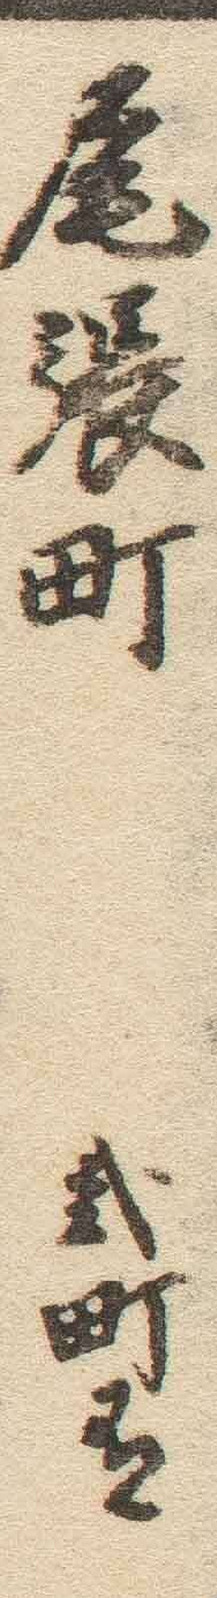尾張町弐町有
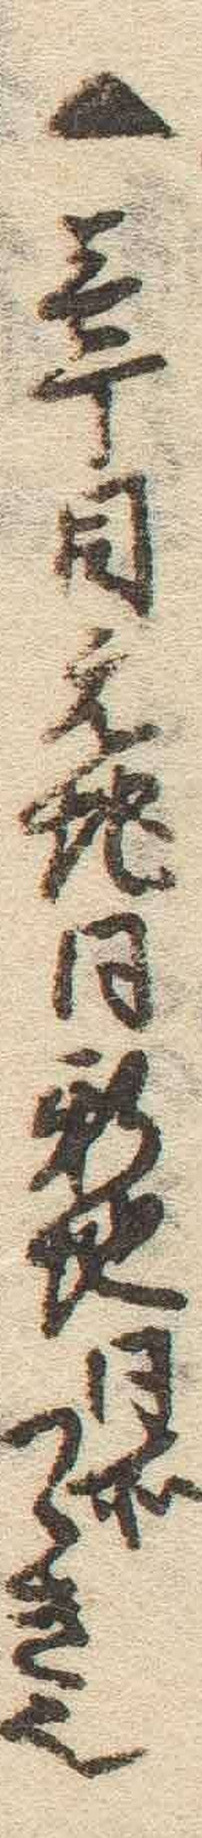▲壱丁目元地同新地同所
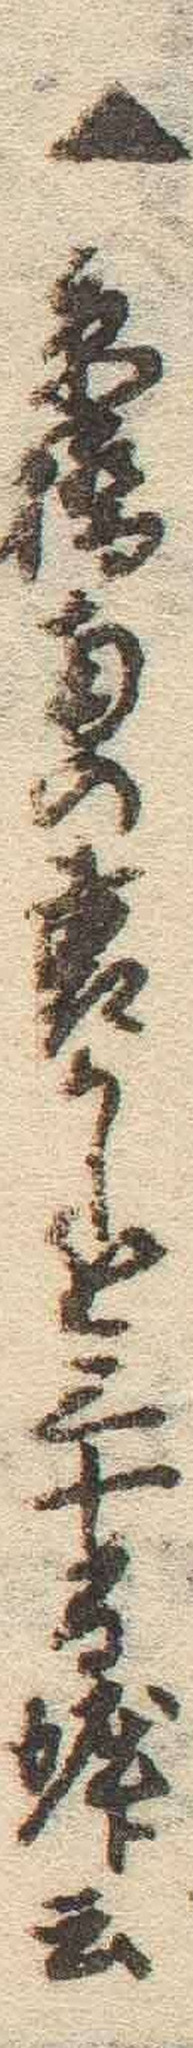▲京橋南の裏かしを三十間掘と云
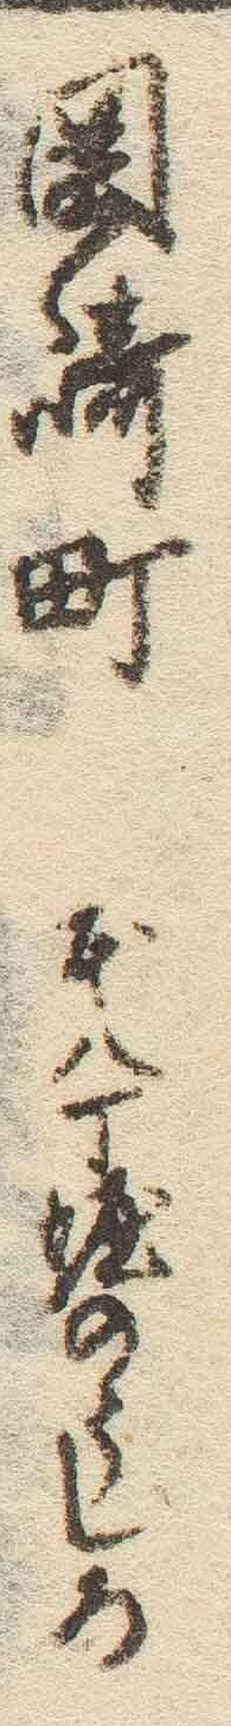岡崎町本八丁堀のうしろ
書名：江戸町独案内
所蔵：東京学芸大学附属図書館 国文学研究資料館
